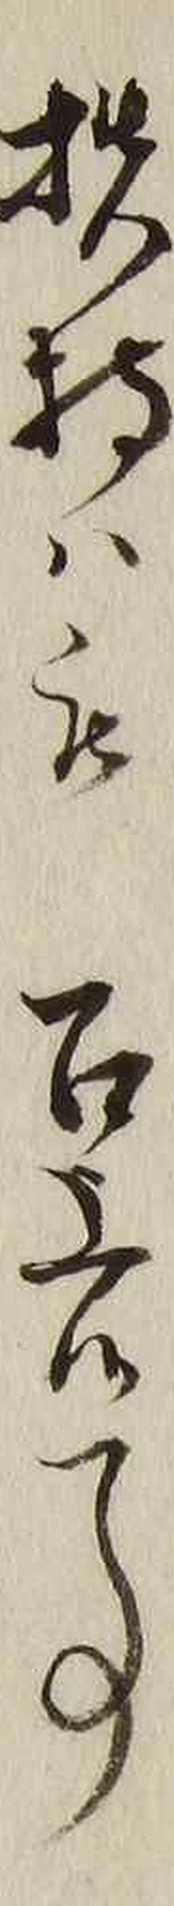扶持ハ被召上候事
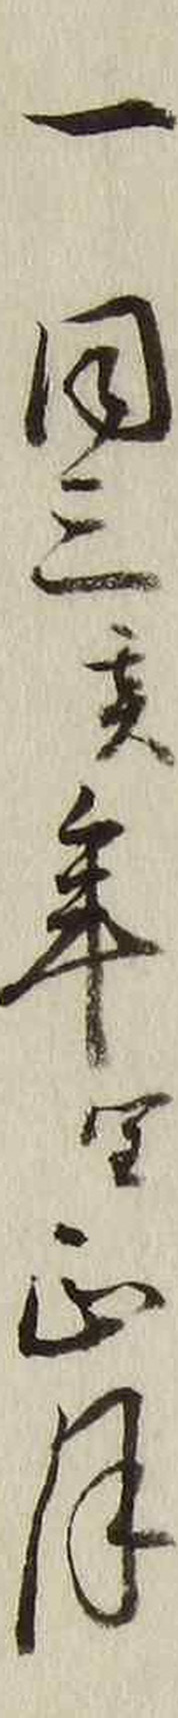一同三亥年閏正月
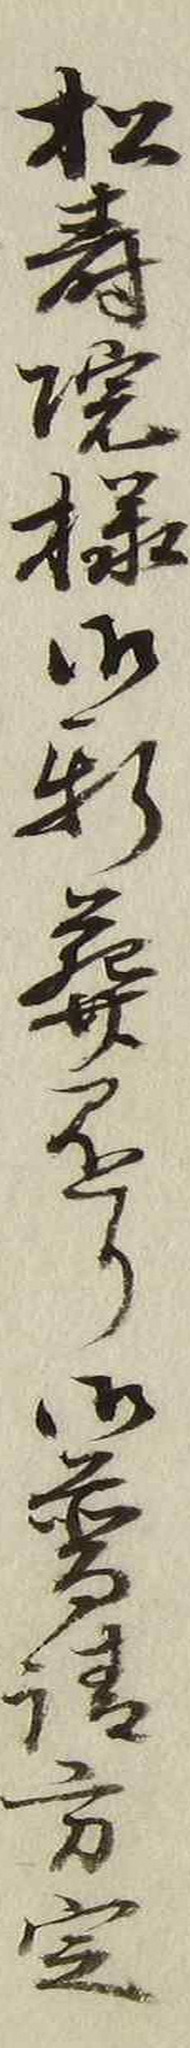松寿院様御新葬懸り御普請方定
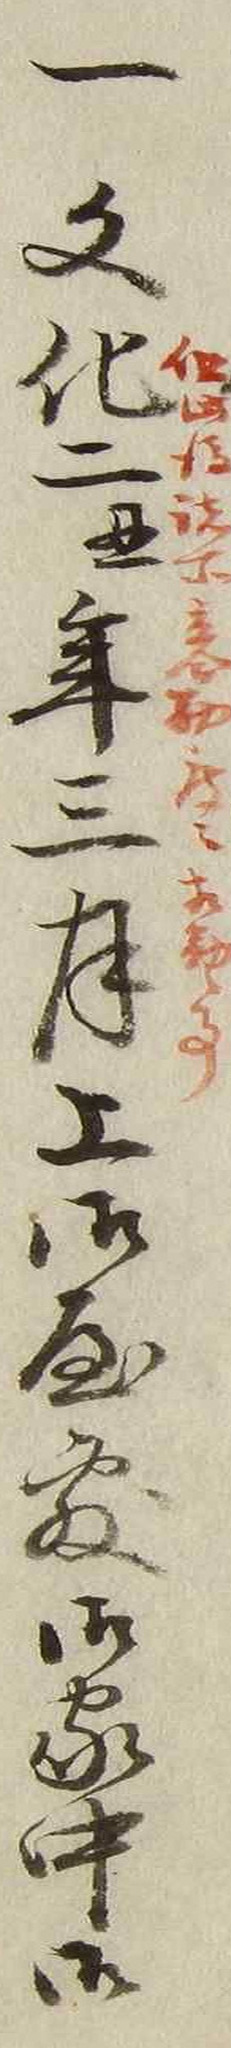一文化二丑年三月上御屋敷御家中御

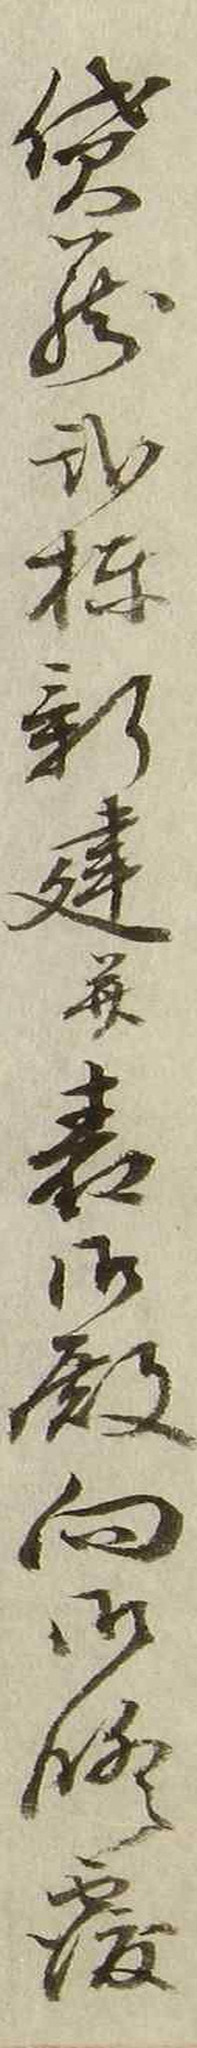貸蔵弐棟新建并表御殿向御修覆
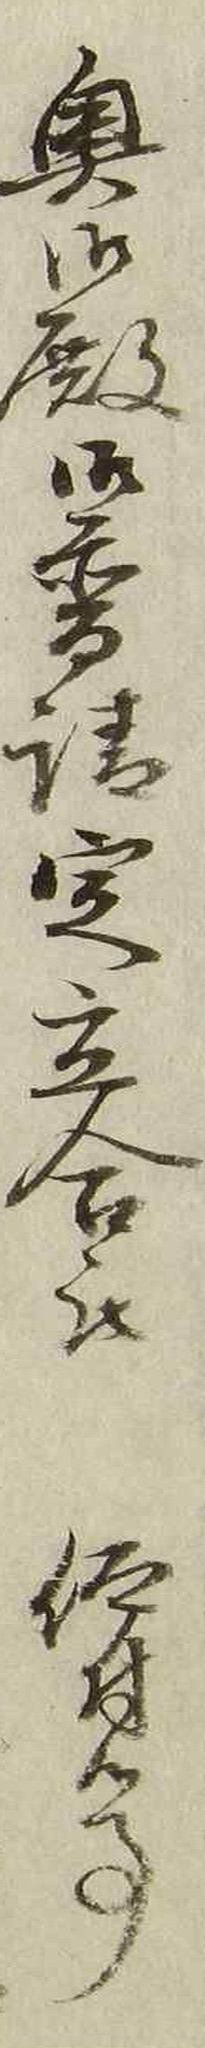奥御殿御普請定立合被仰付候事
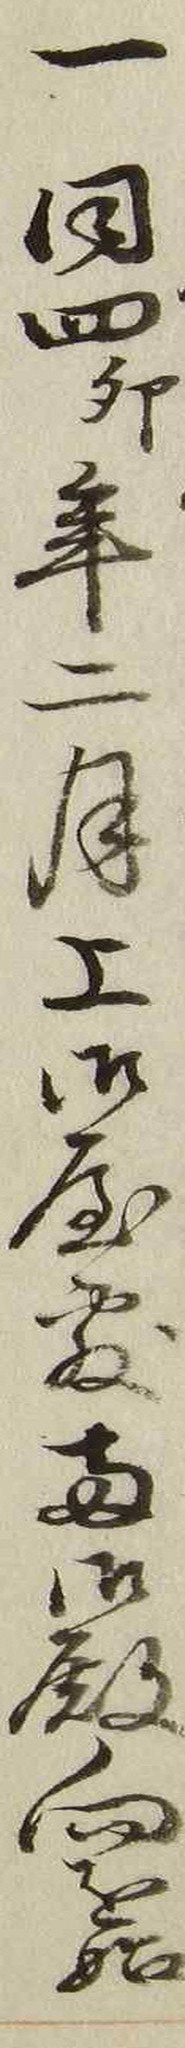一同四卯年二月上御屋敷両御殿向を始
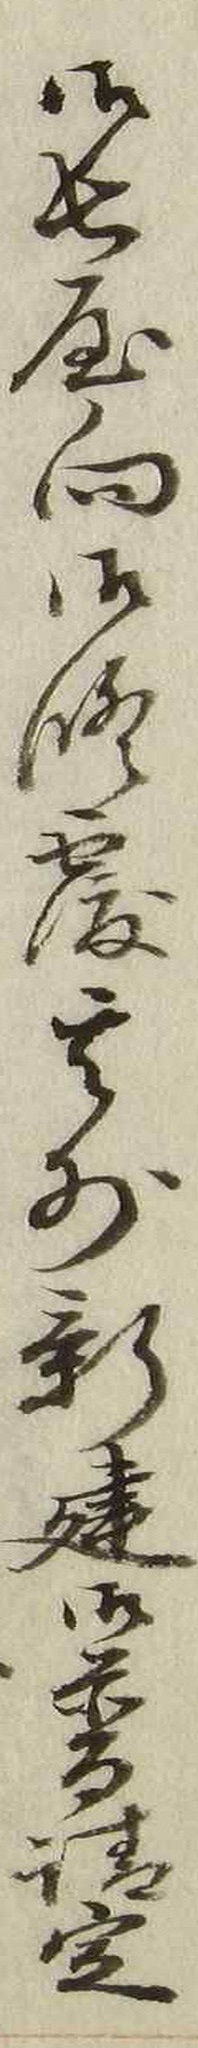御長屋向御修覆其外新建御暮請定
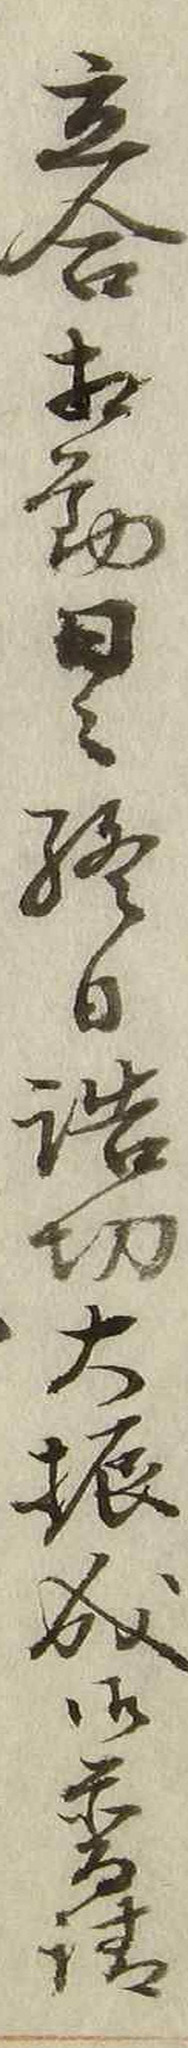立合相勤日々終日詰切大振成御普請
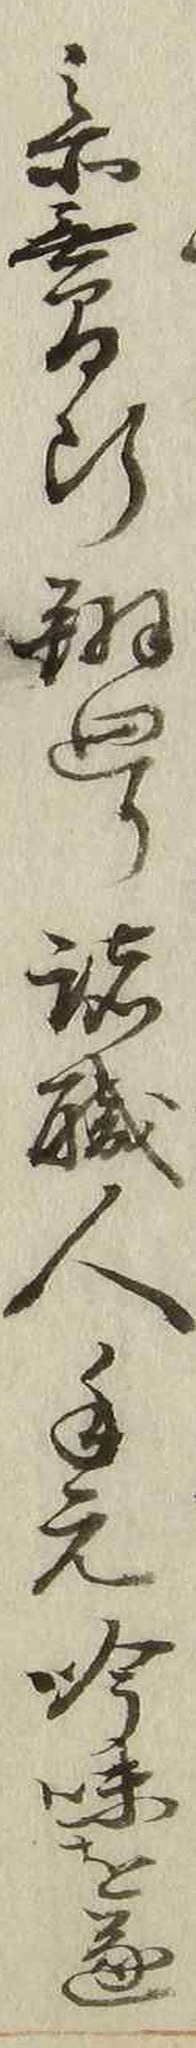之所無間断翔廻り諸職人手元吟味を遂
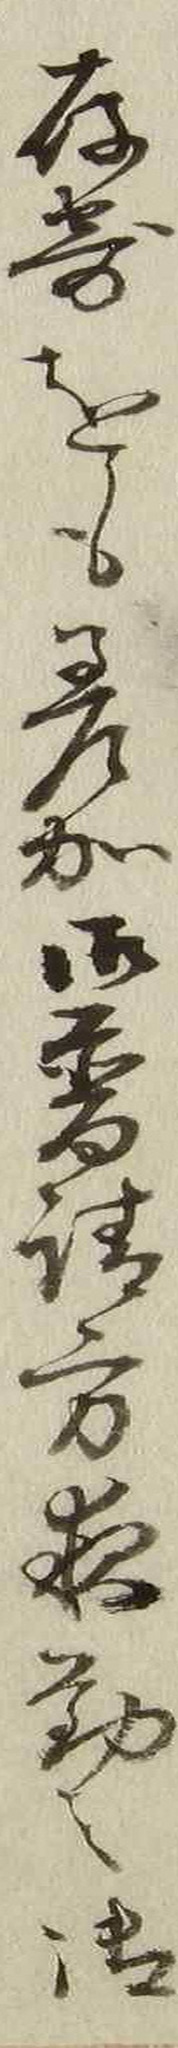存寄をも差加御普請方夜勤之御
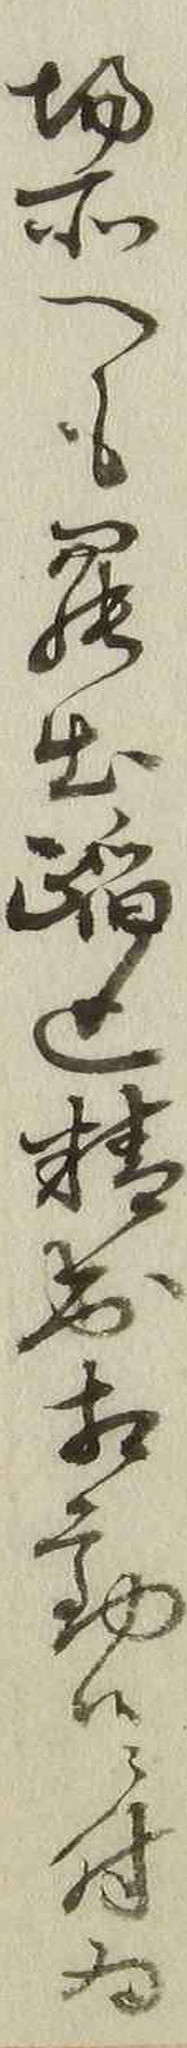場所へも罷出踏込精出相勤候ニ付為
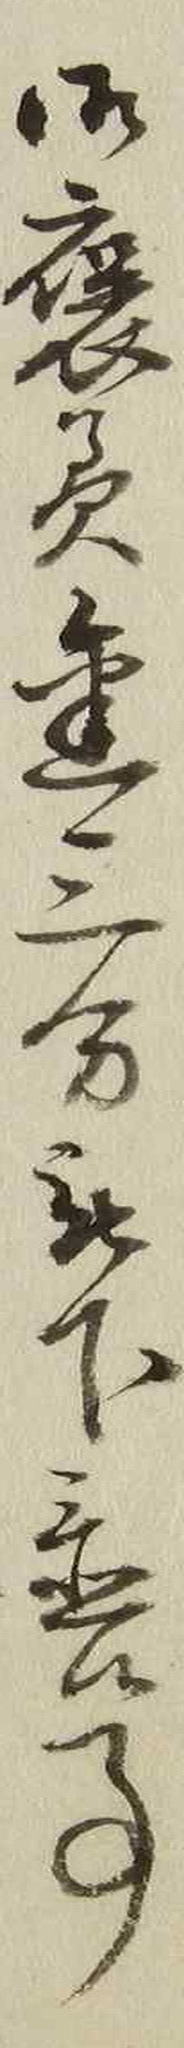御褒美金三分被下置候事
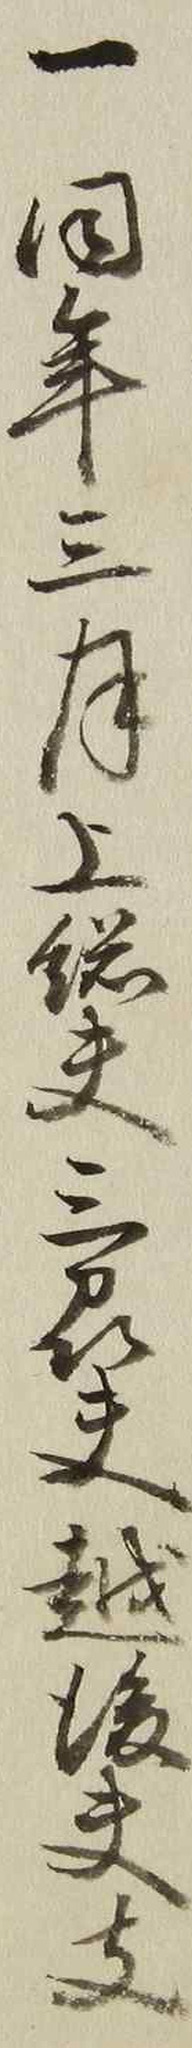一同年三月上総夫三州夫越後夫支
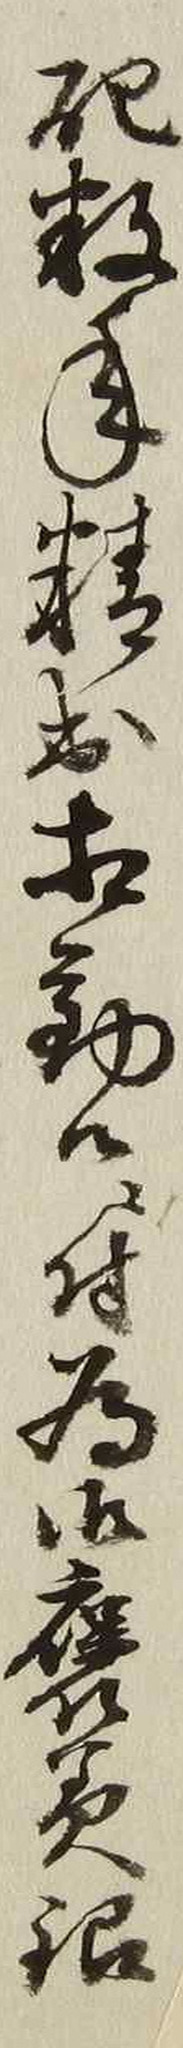配数年精出相勤候ニ付為御褒美銀
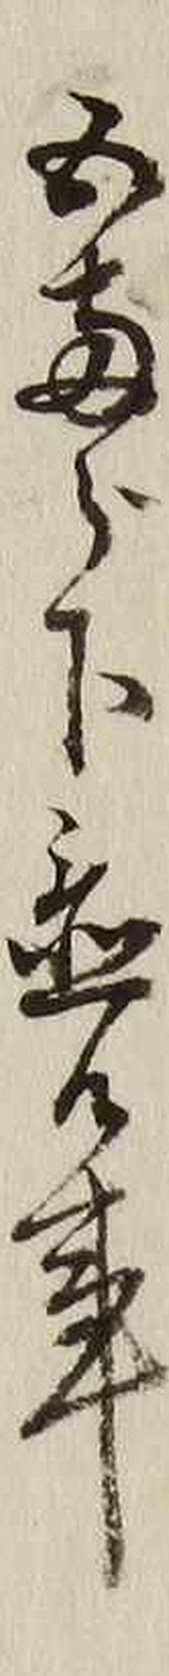五両被下置候事
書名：諸士系譜　巻之39　は之部7
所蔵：会津若松市立会津図書館
